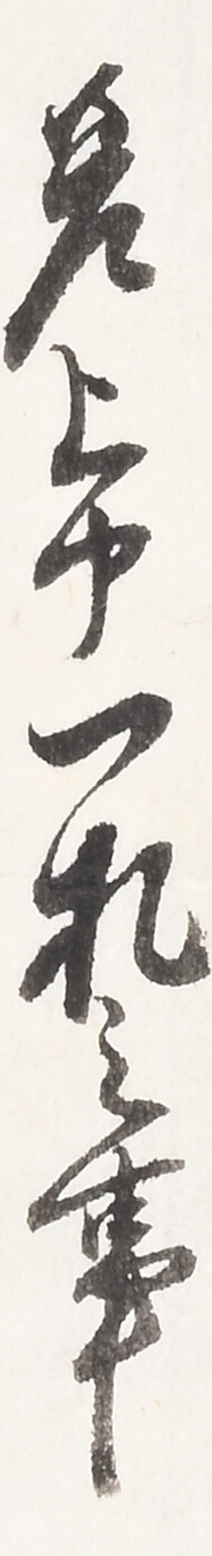差上申一札之事
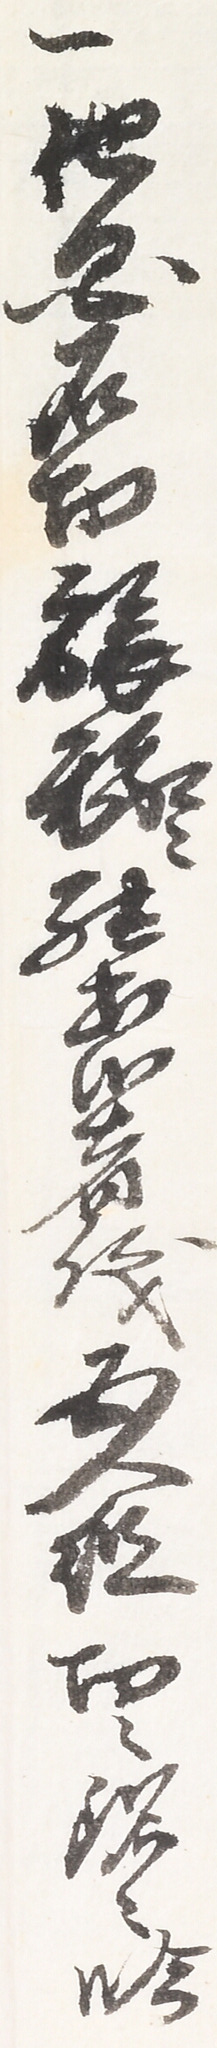一他国石切旅稼ニ罷出候者儀五人組切々銘々吟
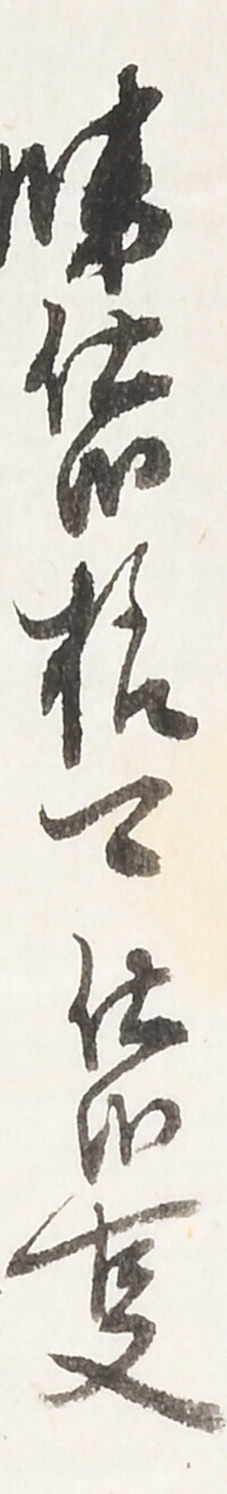味仕候様可仕候事
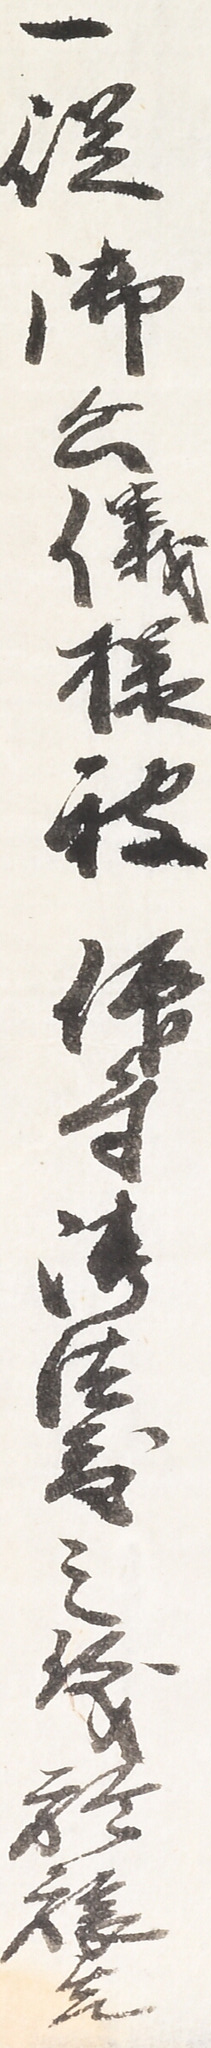一従御公儀様被仰付御法度之儀於旅先
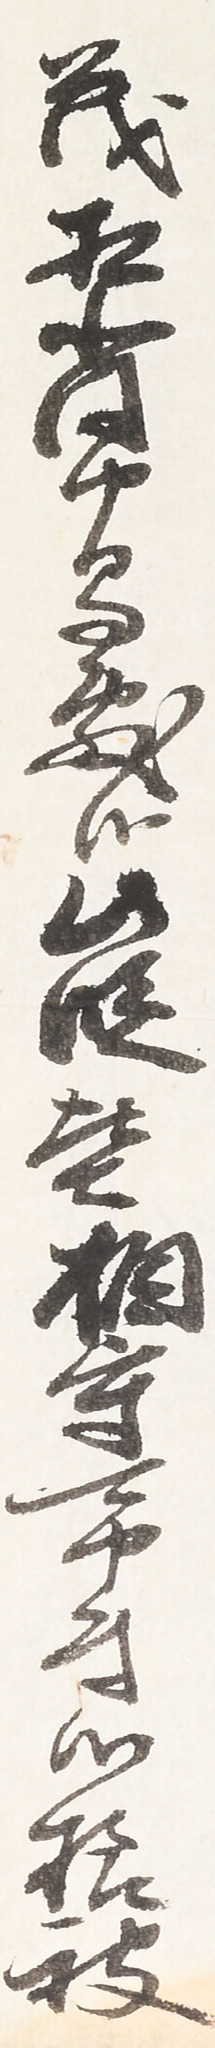も相背申間敷候此段堅相守可申付候様被
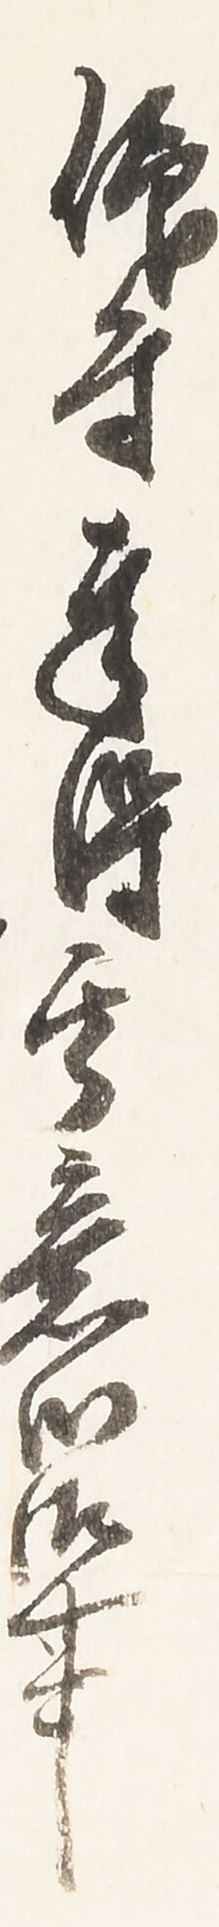仰付奉得其意候御事
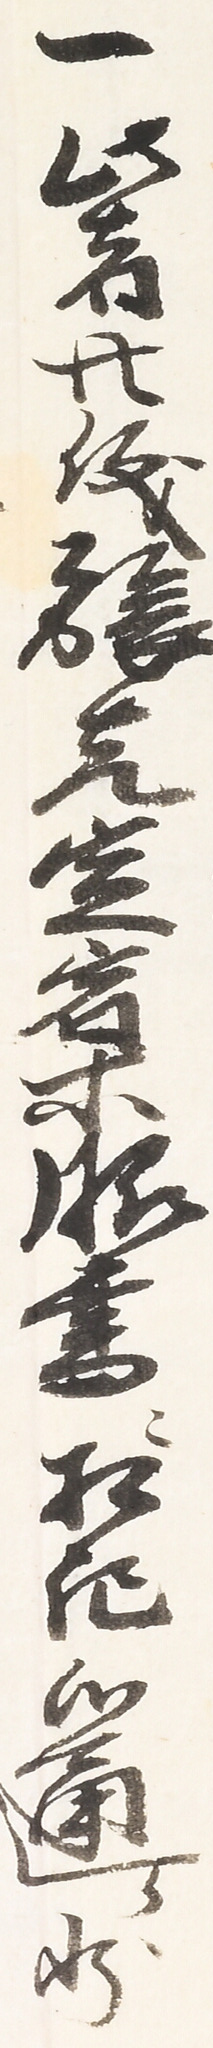一此者共儀旅先定宿等脇書ニ相記候通り少
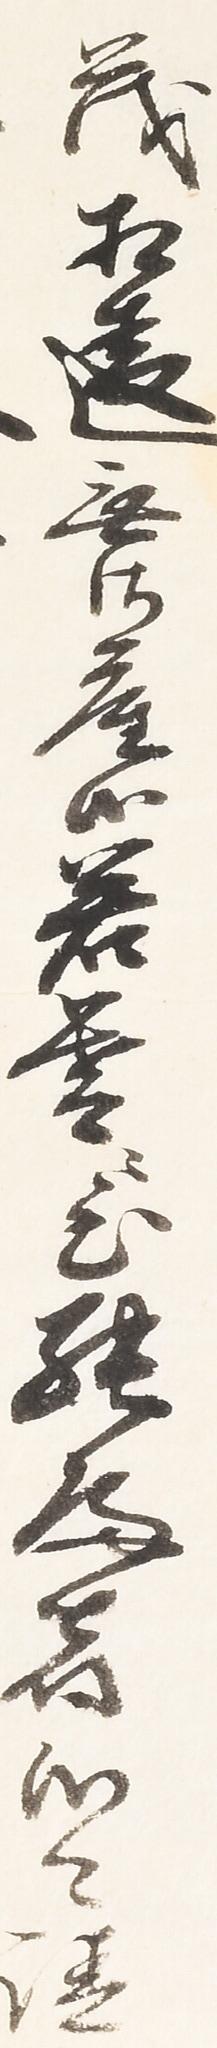も相違無御座候若暮ニ至罷帰者候ハヽ請
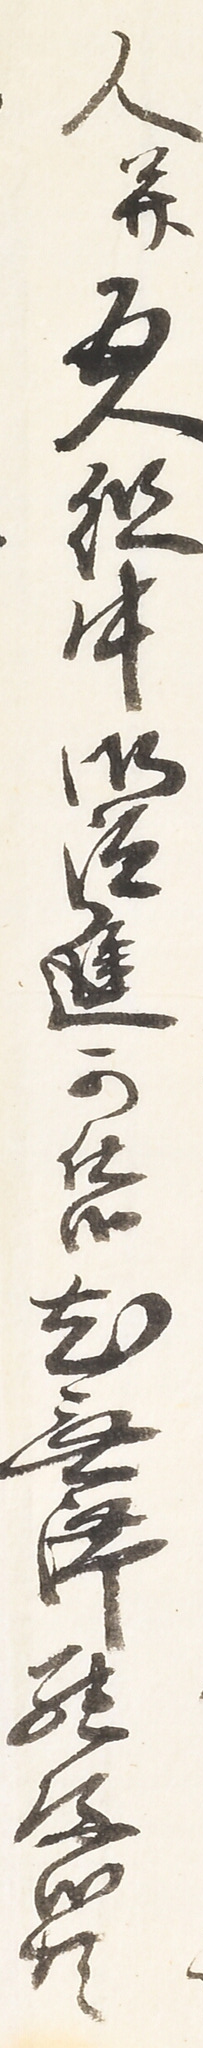人并五人組中御注進可仕候尤無滞罷帰候共
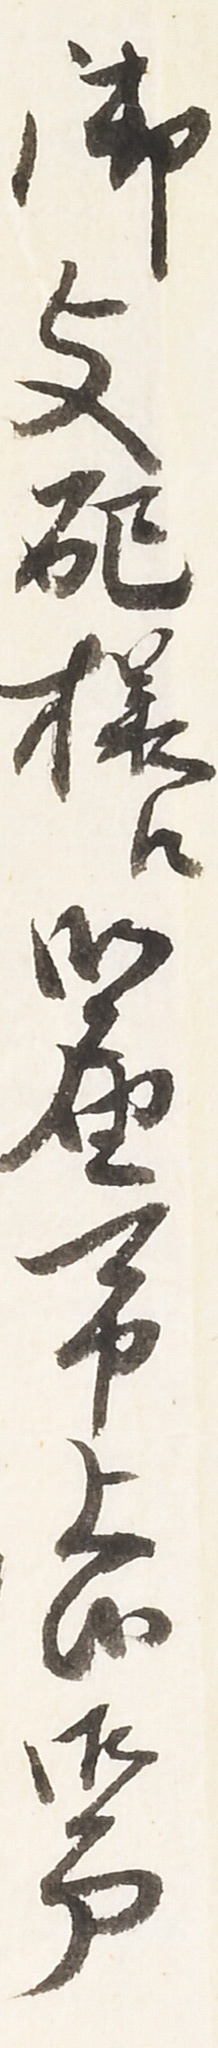御支配様え御届可申上候御事
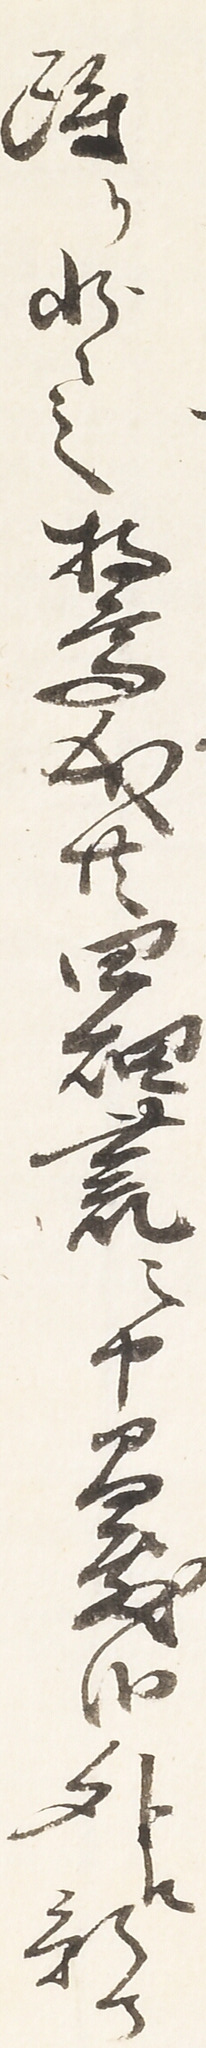附り少々之持高成共田畑荒し申間敷候外え預ケ
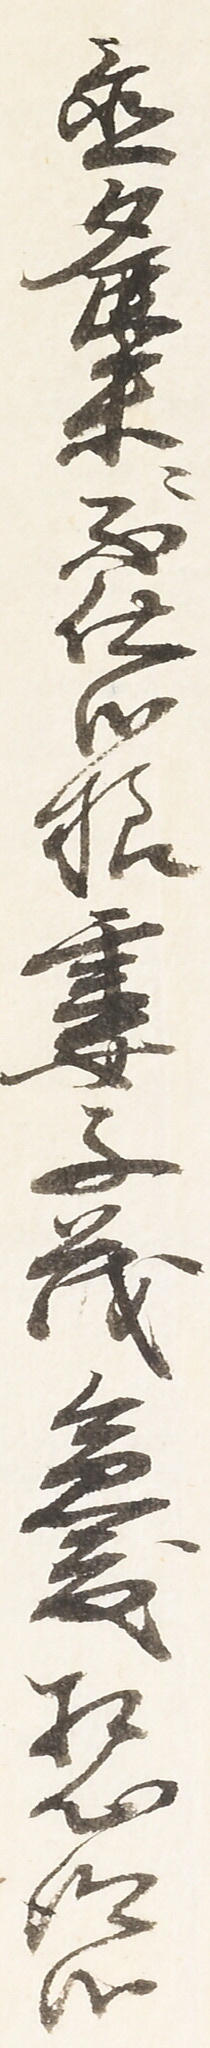置麁末ニ不仕候様妻子も急度相心得候
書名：差上申一札之事
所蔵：伊那市立高遠町図書館・合同会社AMANE
